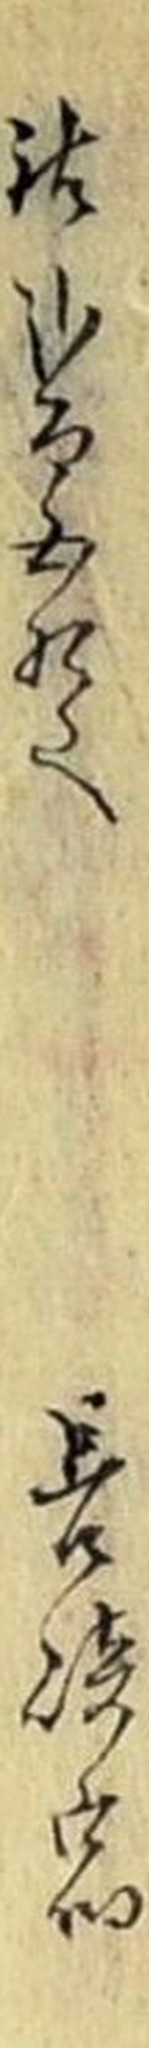銀弐百五拾匁長崎宿
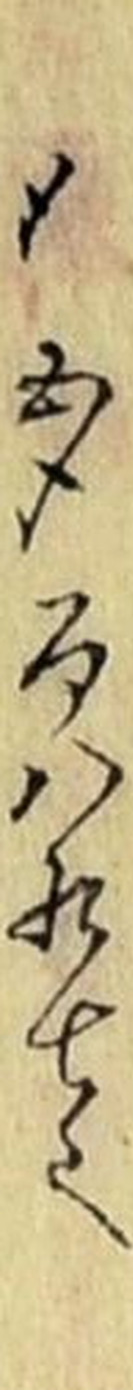〆五貫百八拾七匁
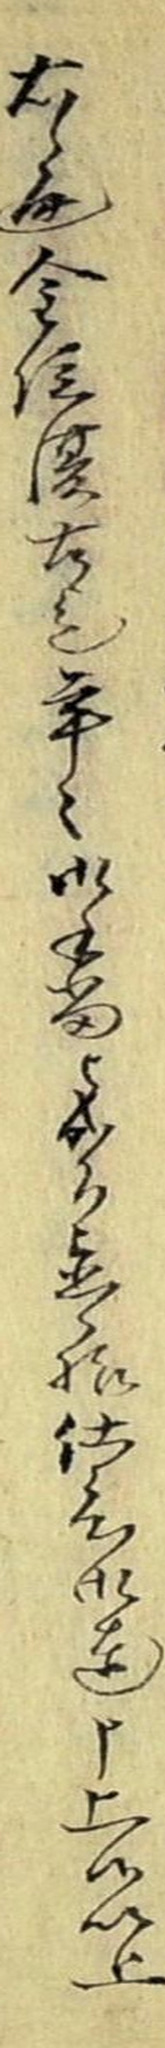右之通金位復古迄年々御手当被成下置候様仕度御達申上候以上
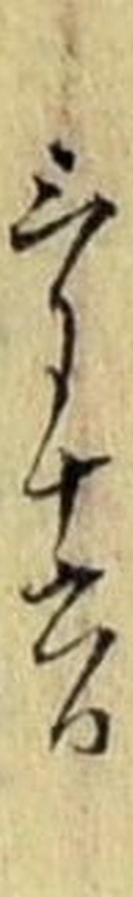三月十六日
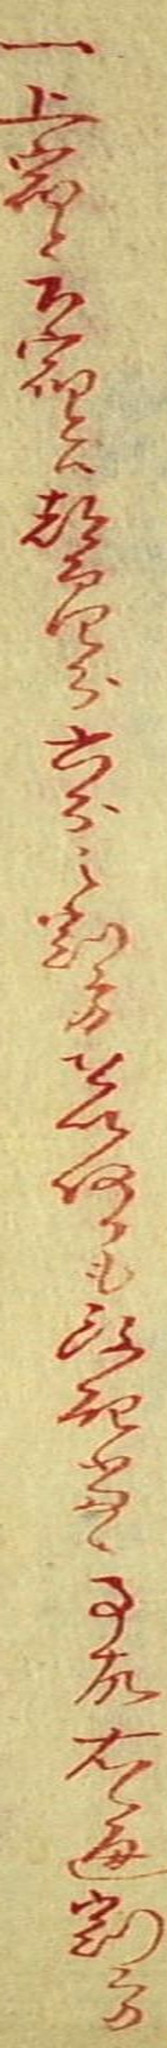一上宿と下宿とは都而四分六分之割方を以何りも致配当候事故右之通割方

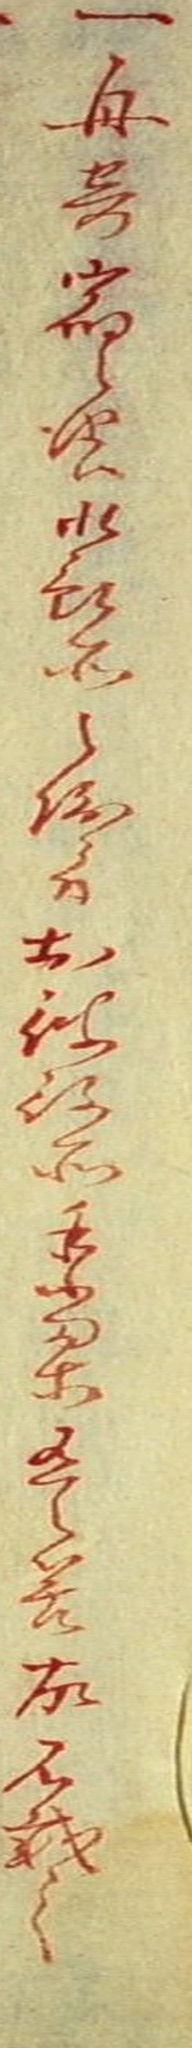一舟寄宿之儀は御預所之儀に付於波役所手当等有之筈故不載之
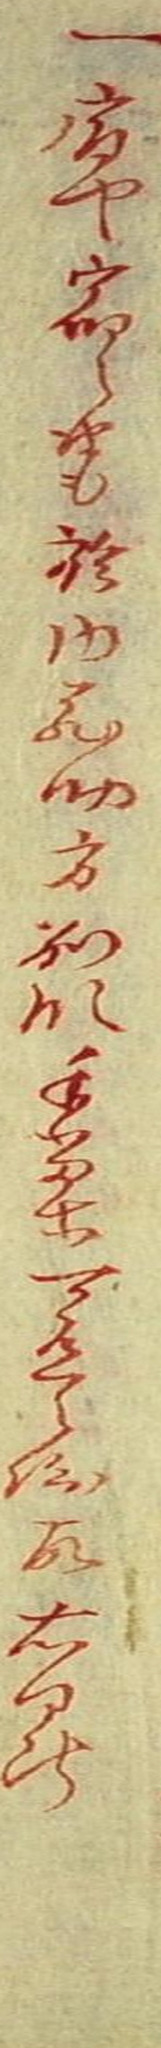一府中宿之儀も於内蔵助方別段手当等可有之候儀故右同断
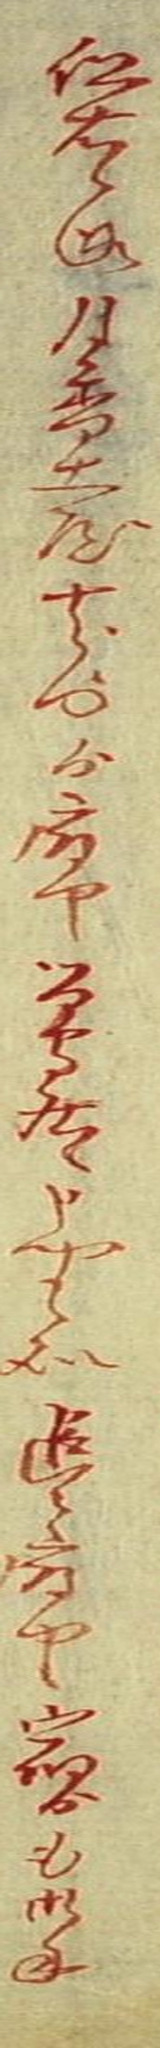但右之趣月番土屋十郎右衛門ゟ府中留守居へ申聞候処追々府中宿ゟも御手
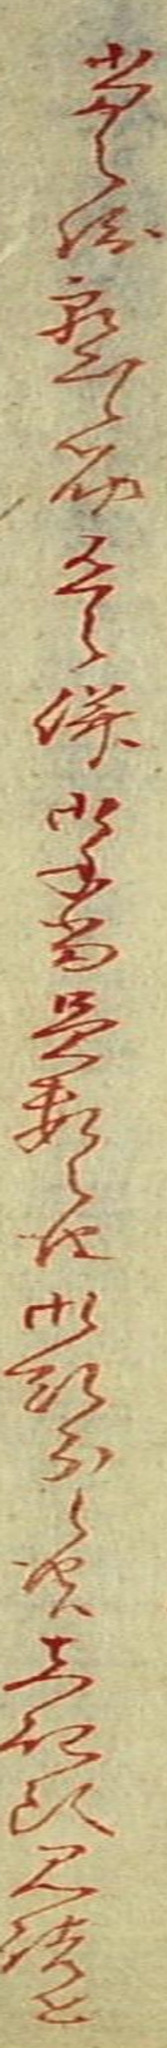当之儀願出候筋有之併御手当員数之儀御領分之儀は支配頭見詰を
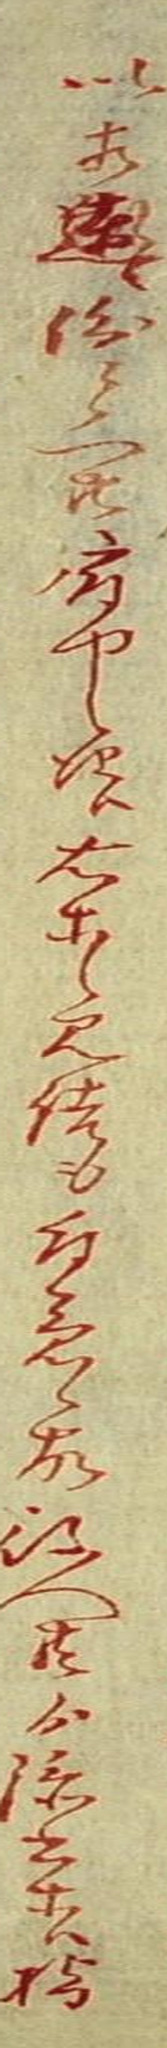以相達候儀に候へ共府中之儀は右等之見詰も付兼候故役人共ゟ添書等は指
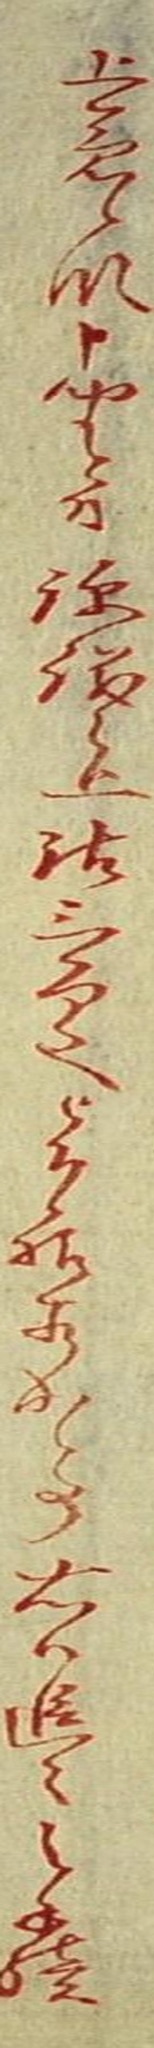上兼候段申聞候に付評議之上銀三百匁被下候様相成候事右は追々之手続
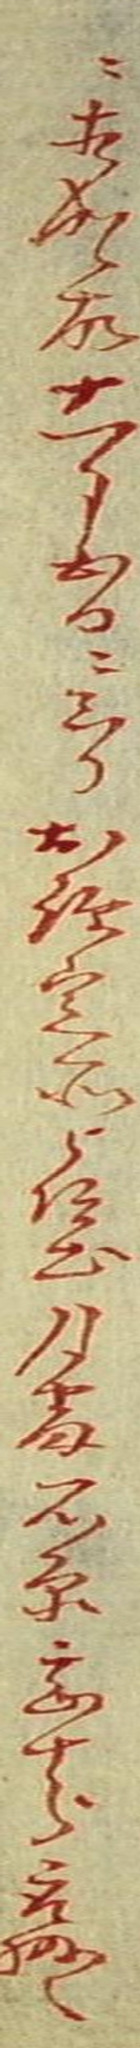に相成候故十一月五日に至り於評定所被仰出月番石原甚十郎取扱之
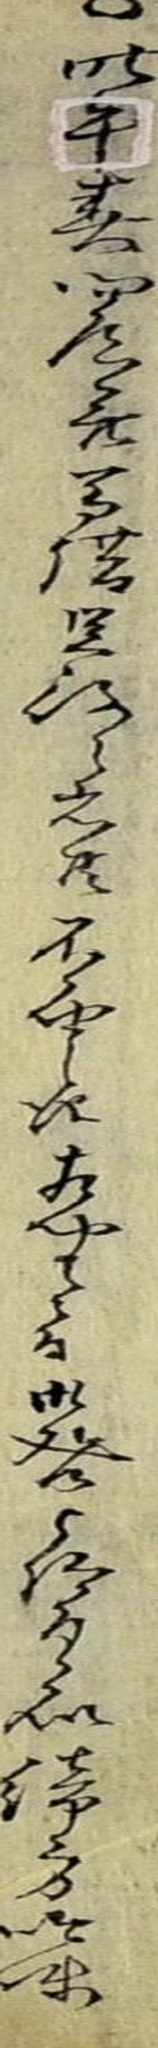○昨午春問屋并馬借足役之者共不届之儀相聞候に付御咎被仰付候処締方吟味
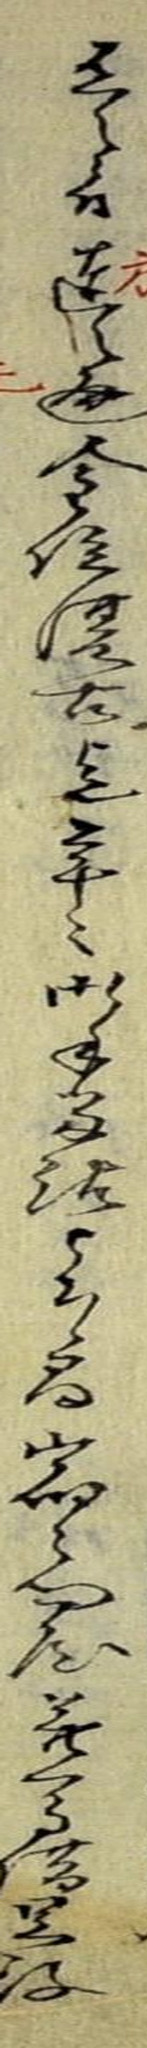有之候に付達之通金位復古迄年々御手当銀被下候間宿之問屋并馬借足役
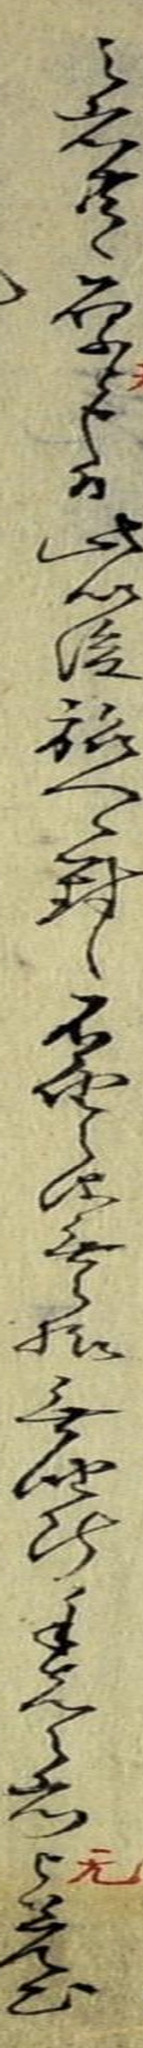之者共へ厚被申付此以後旅人へ対し不届之儀無之様無由断手先之者無差出
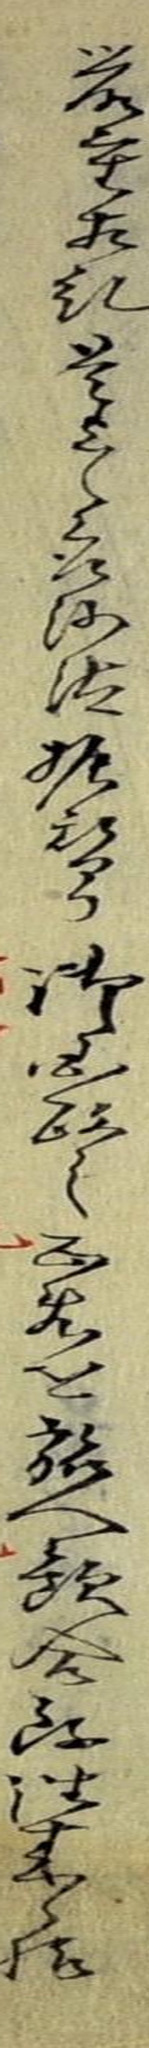厳重相糺是迄之取沙汰振替り御国政之正敷を旅人歓合致往来候様
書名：命令之部 六
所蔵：福井県文書館 Fukui Prefectural Archives
